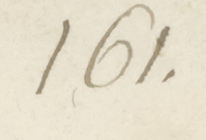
161.
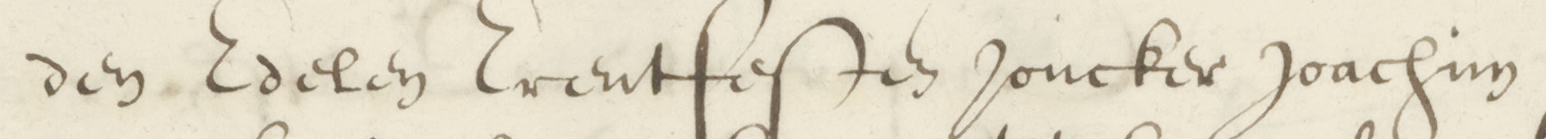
den Edelen Erentfesten joncker Joachim
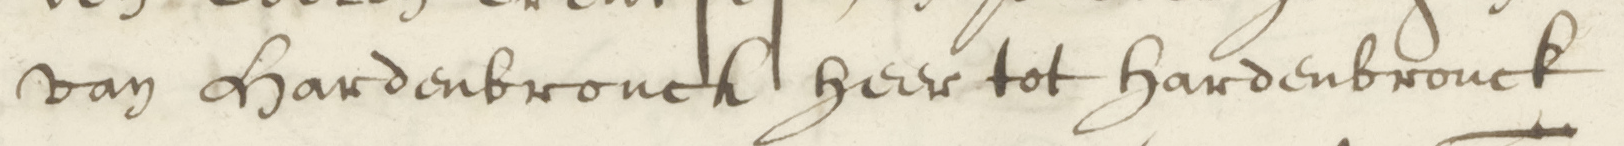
van Hardenbrouck heer tot Hardenbrouck
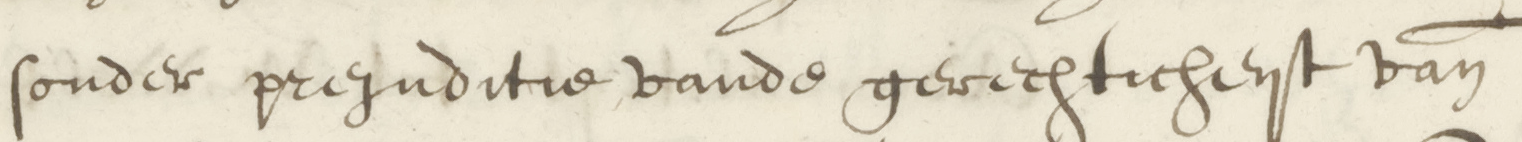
sonder prejuditie vande gerechticheyt van
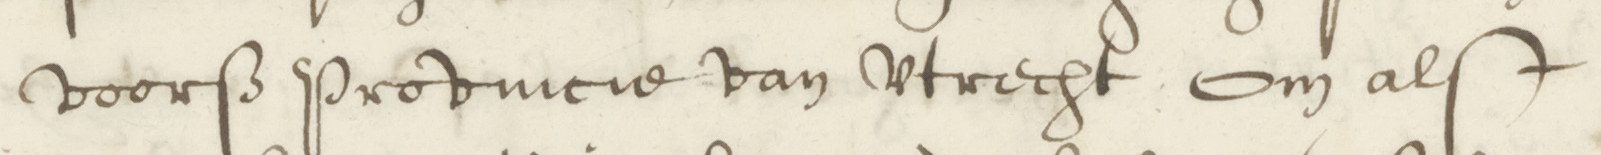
voors Provincie van Utrecht, om alst
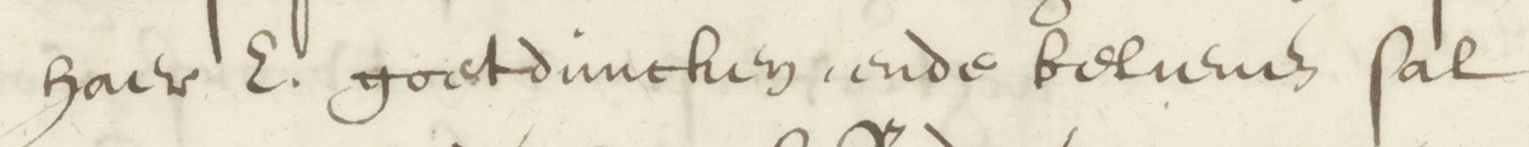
haer E. goetduncken, ende belieuen sal
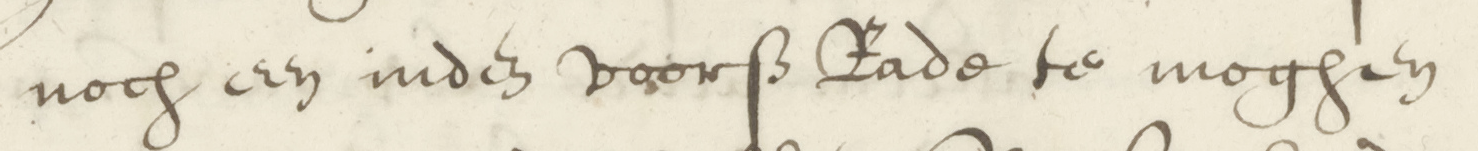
noch een inden voors Rade te moghen
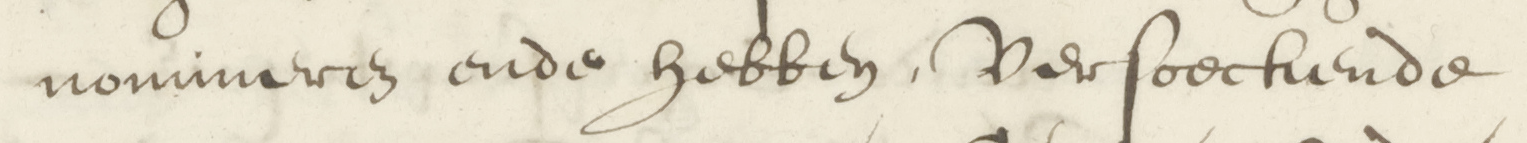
nomineren, ende hebben, versoeckende
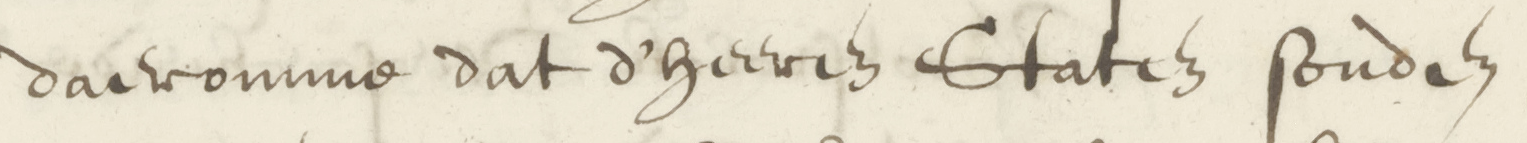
daeromme dat d'heeren Staten souden
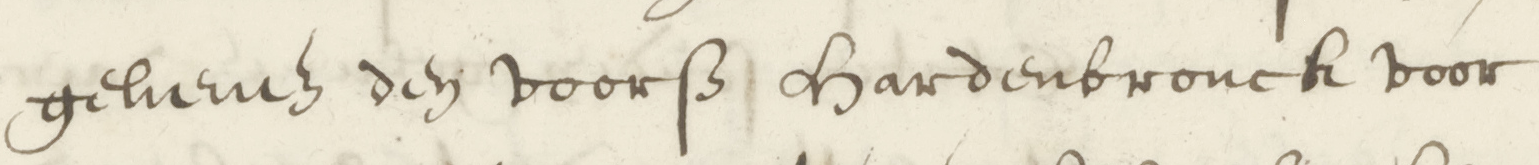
gelieuen den voors Hardenbrouck voor
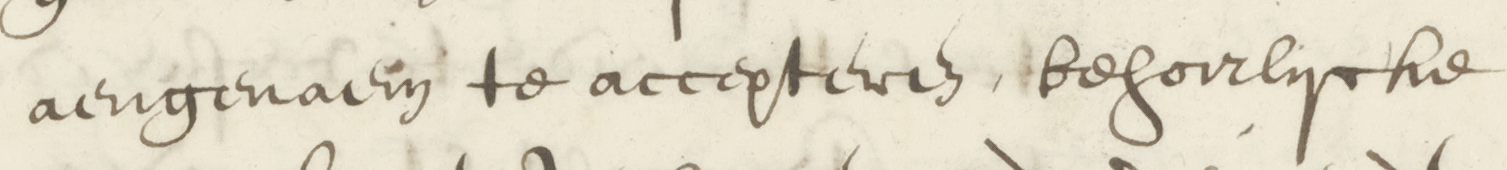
aengenaem te accepteren, behoirlijcke
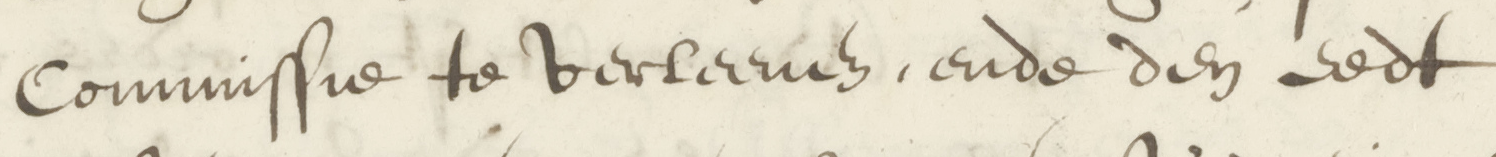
Commissie te verleenen, ende den eedt
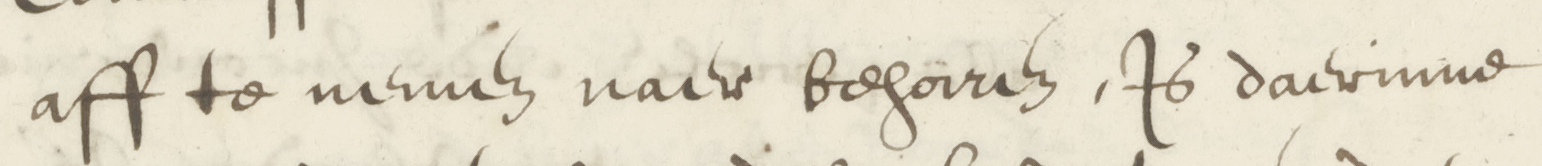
aff te nemen naer behoiren. Is daerinne
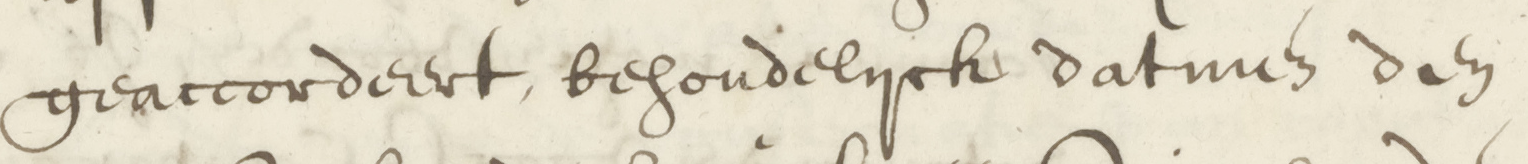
geaccordeert, behoudelyck datmen den
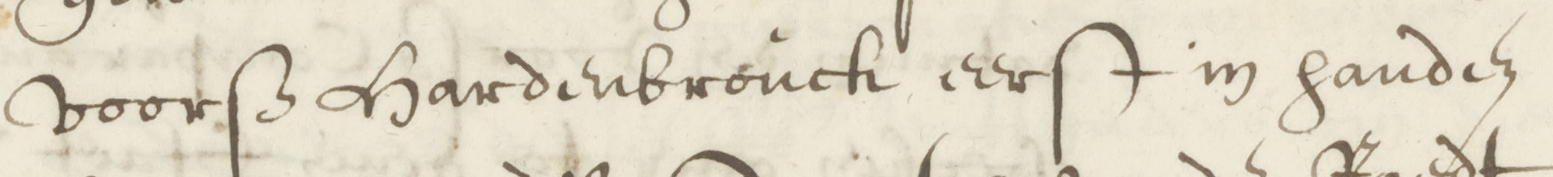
voors Hardenbrouck eerst in handen
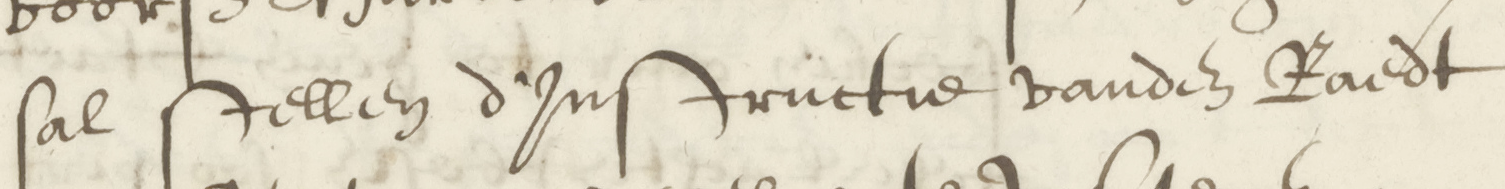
sal stellen d'Instructie vanden Raedt
